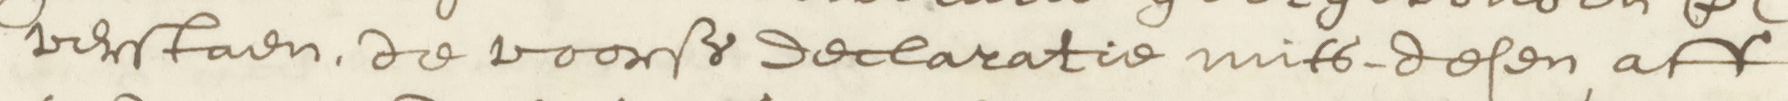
verstaen, de voors declaratie mits desen aff
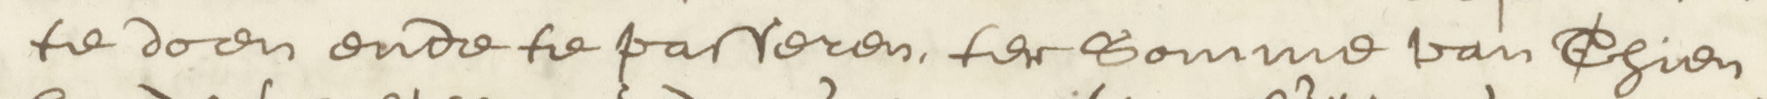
te doen ende te passeren, ter Somme van Thien
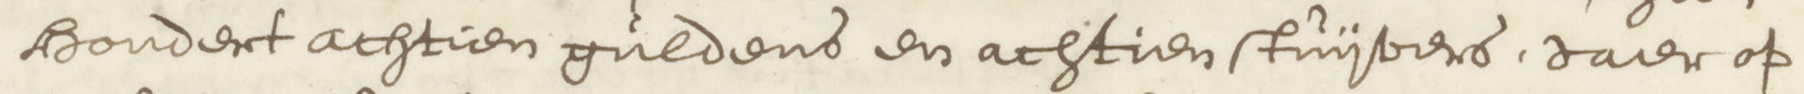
hondert achtien guldens en achtien stuijvers, daer op
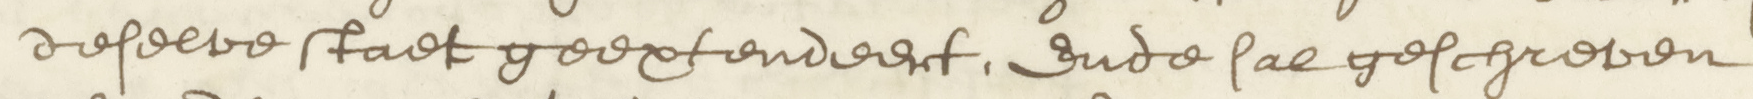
deselve staet geextendeert, Ende sal geschreven
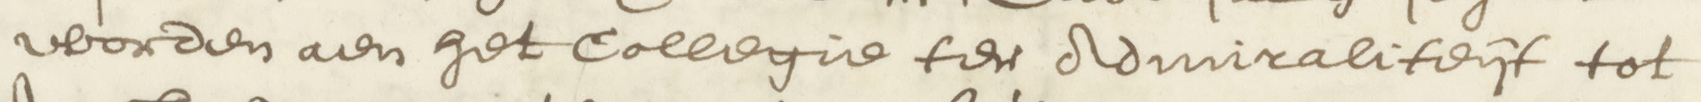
worden aen het Collegie ter Admiraliteijt tot
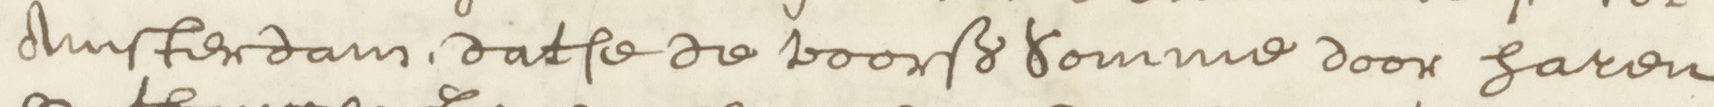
Amsterdam, datse de voors Somme door haren
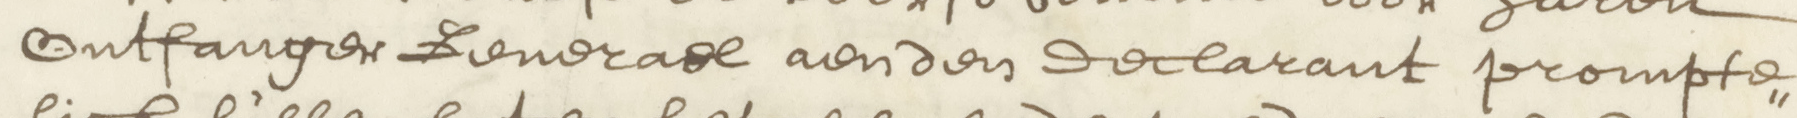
Ontfanger Generael aen den declarant prompte„
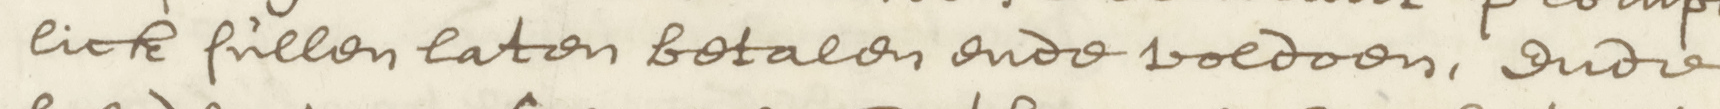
lick sullen laten betalen ende voldoen, ende
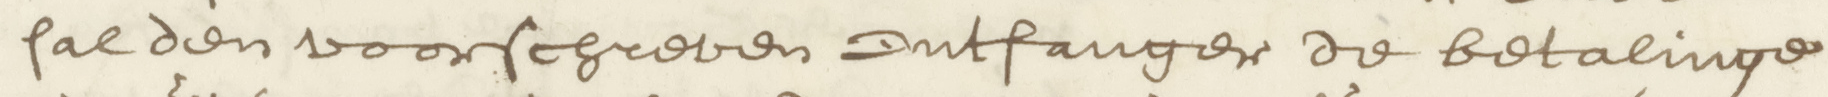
sal den voorschreven Ontfanger de betalinge
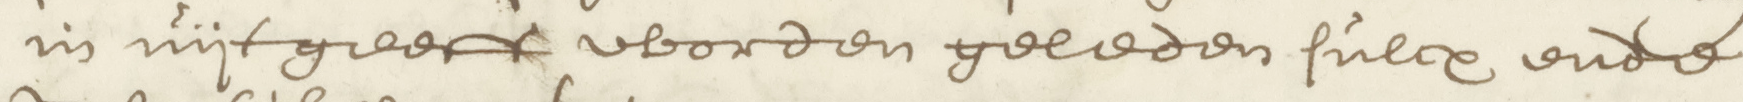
in uijtgeeff worden geleden sulcx ende
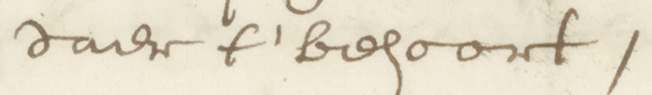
daer t' behoort.
